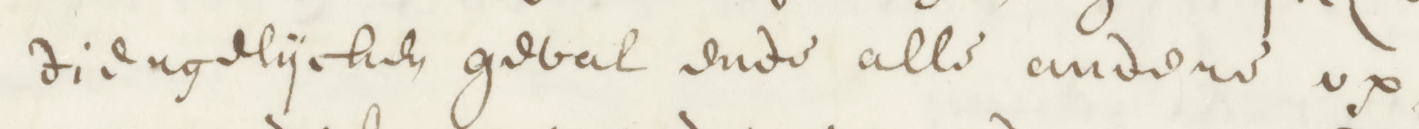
diergelijcken geval ende alle andere op„
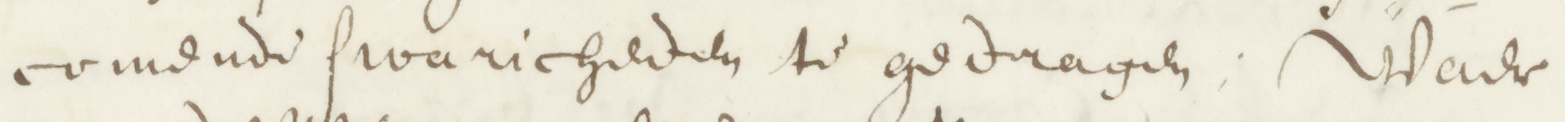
comdende swaricheden te gedragen; Waer
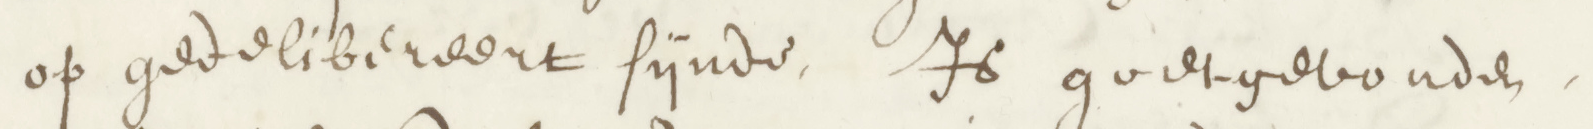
op gedelibereert sijnde, Is goetgevonden
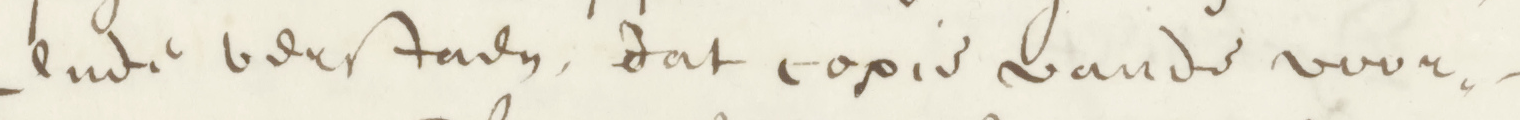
ende verstaen dat copie vande voor„
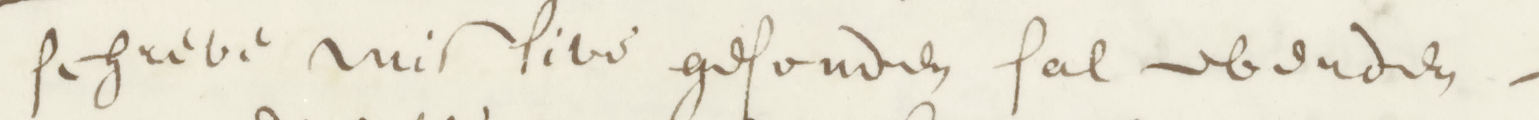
schreve missive gesonden sal werden
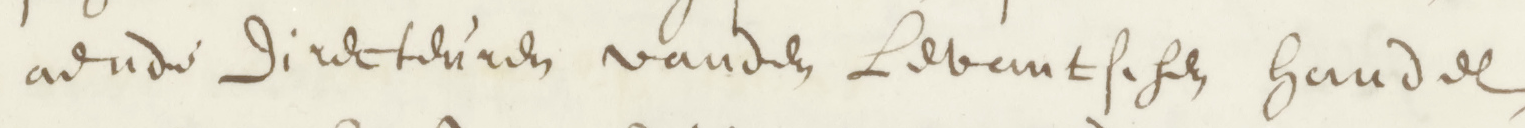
aende Directeuren vanden Levantschen handel
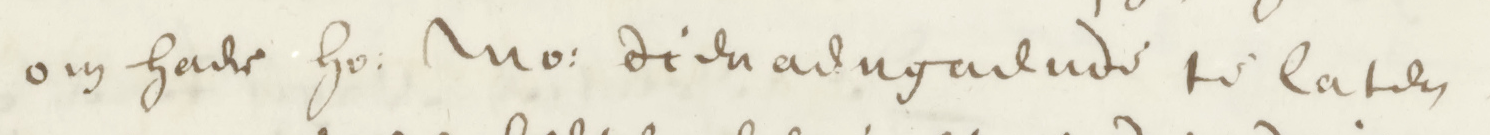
om haer Ho:Mo: dienaengaende te laten
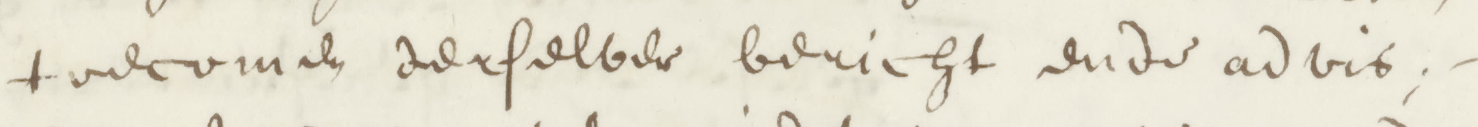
toeceomen derselver bericht ende advis
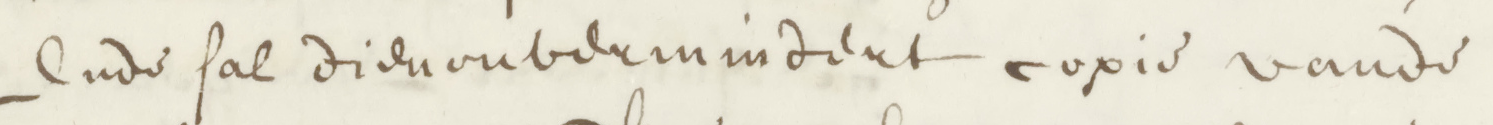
ende sal dien onvermindert copie vande
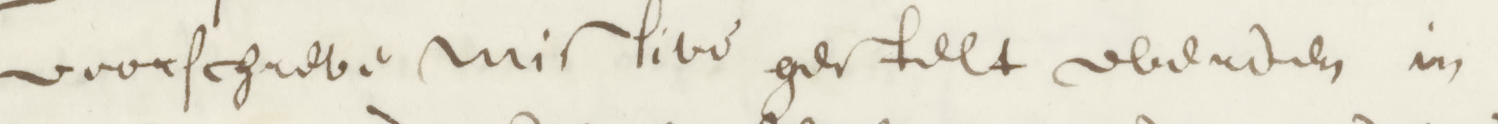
voorschreve missive gestelt werden in
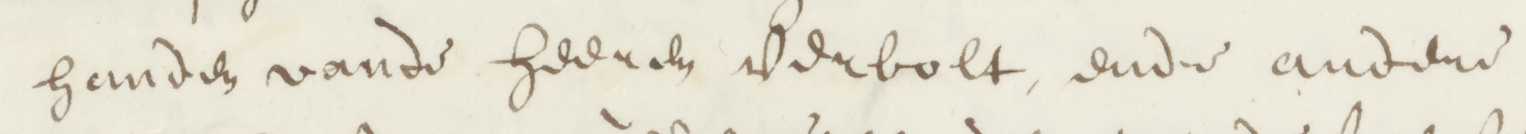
handen vade heeren Verbolt ende andere
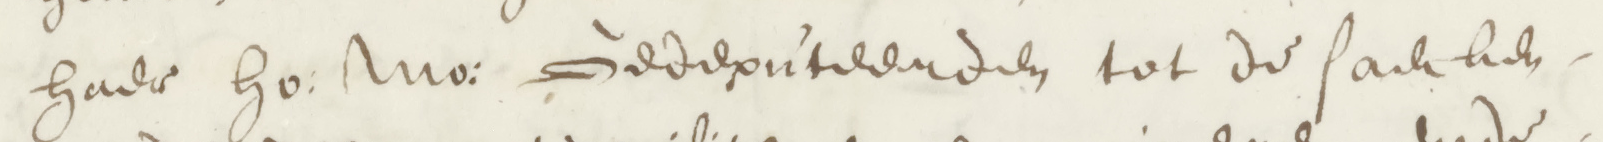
haer Ho:Mo: Gedeputeerden tot de saecken
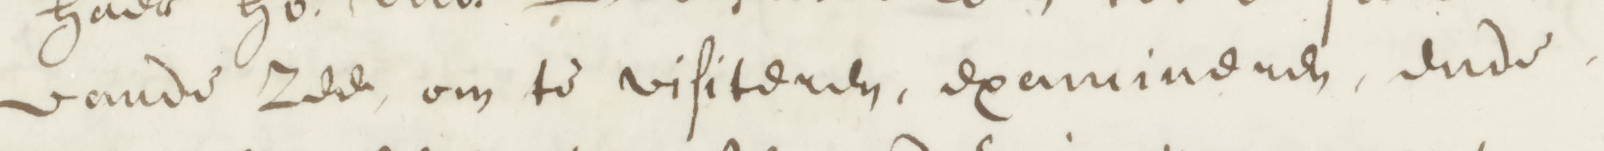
vande Zee om te visiteren, examineren, ende
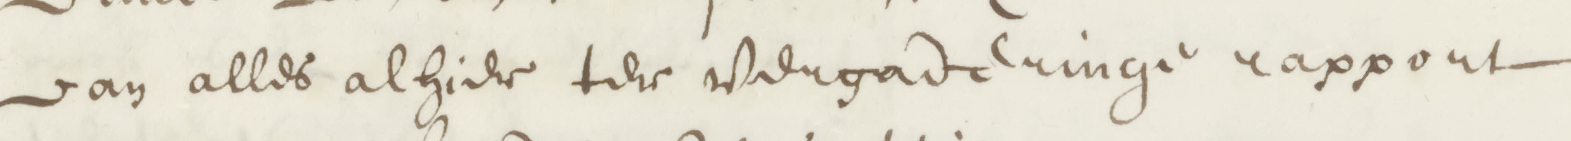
van alles alhier ter vergaderinge rapport
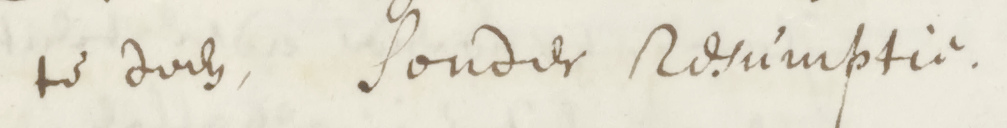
te doen, sonder resumptie.
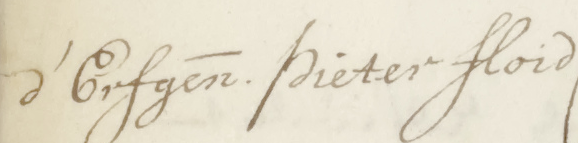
d'Erfgen. Pieter floid
